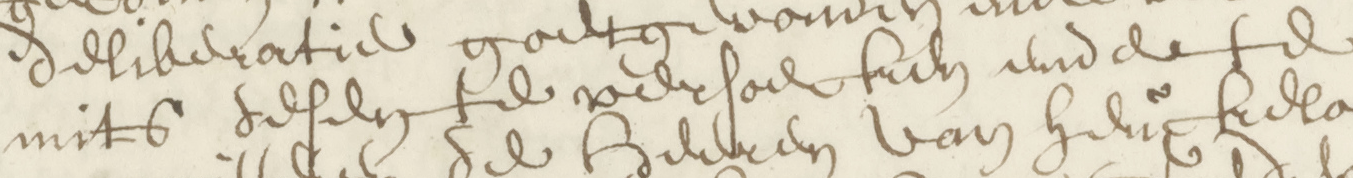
mits desen te versoecken ende te
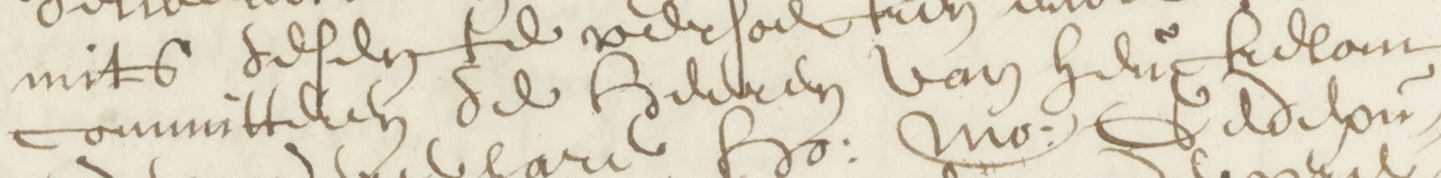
committeren de Heeren van heuckelom
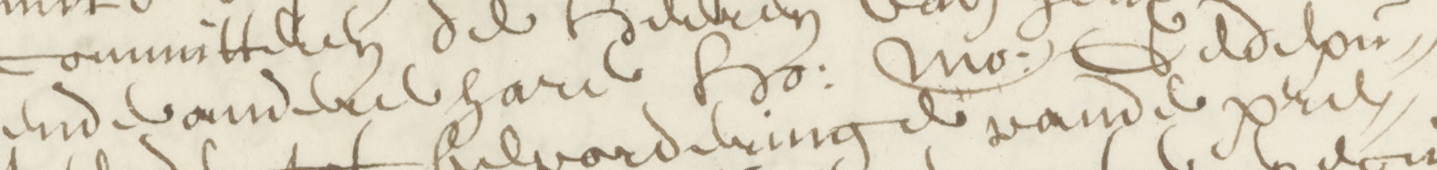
ende andere hare Ho:Mo: Gedepu„
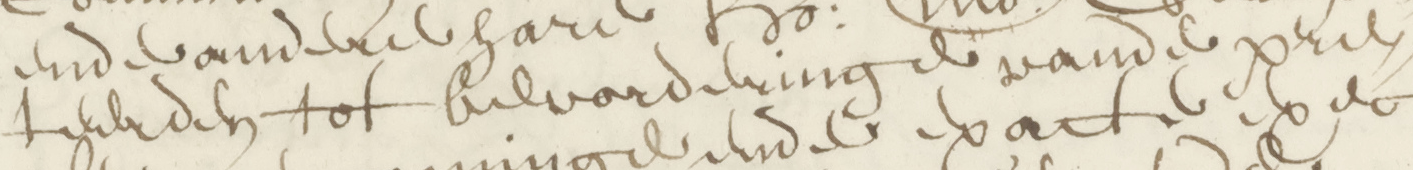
teerden tot bevorderinge vande pre„
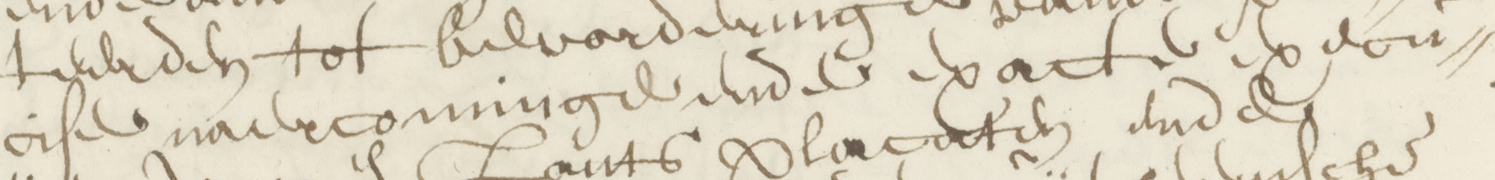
cise naercominge ende exacte execu„
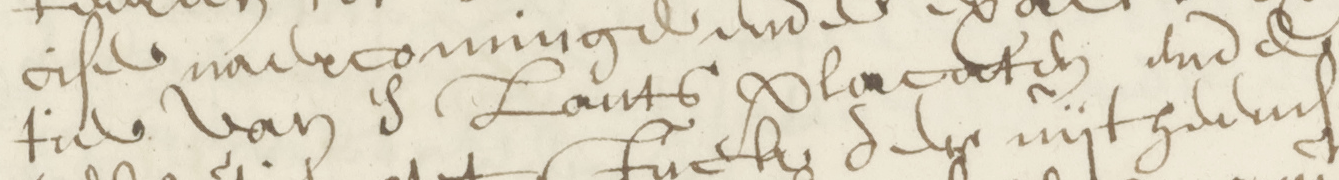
tie van ‛s Lants placaten ende
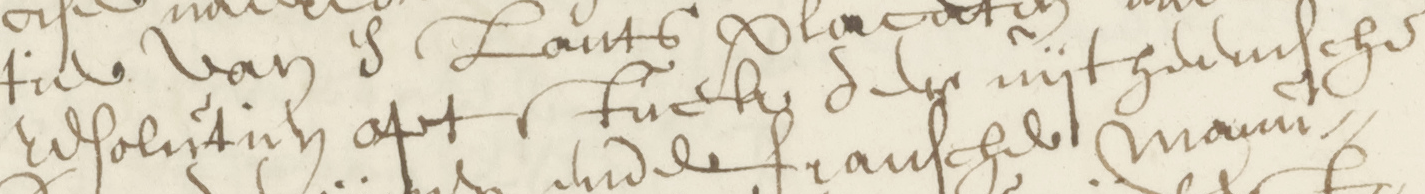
resolutien opt stuck der uijtheemsche
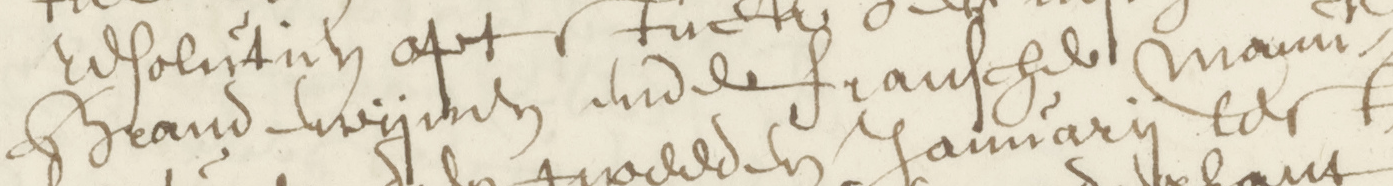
Brandewijnen ende fransche manu„
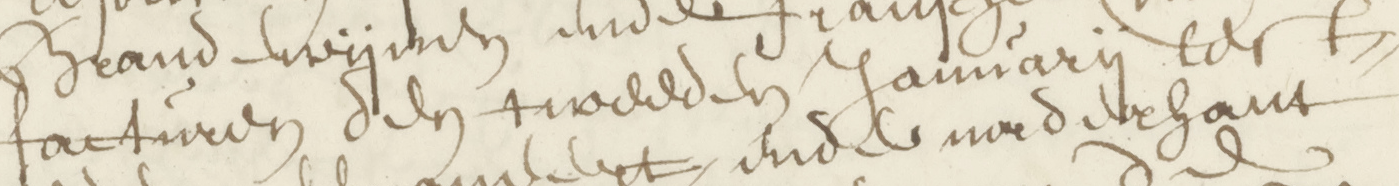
facturen den tweeden Januarij lest„
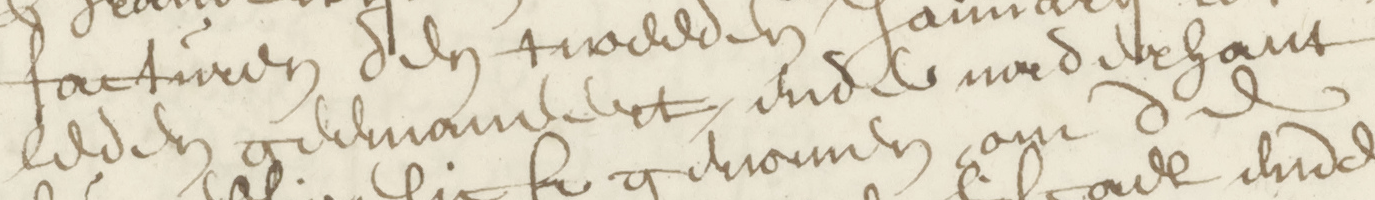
leden geemaneert, ende naderhant
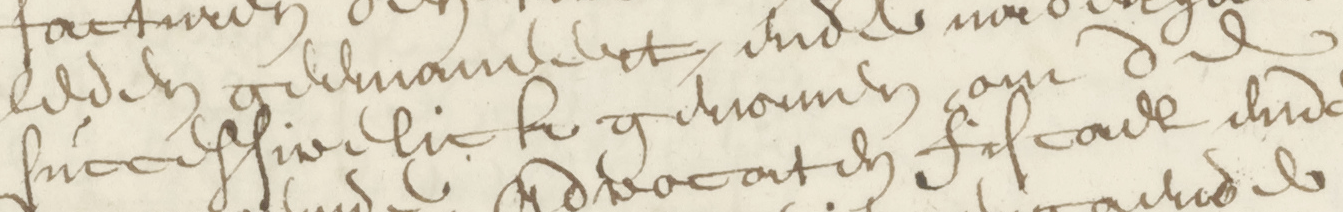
successivelick genomen om de
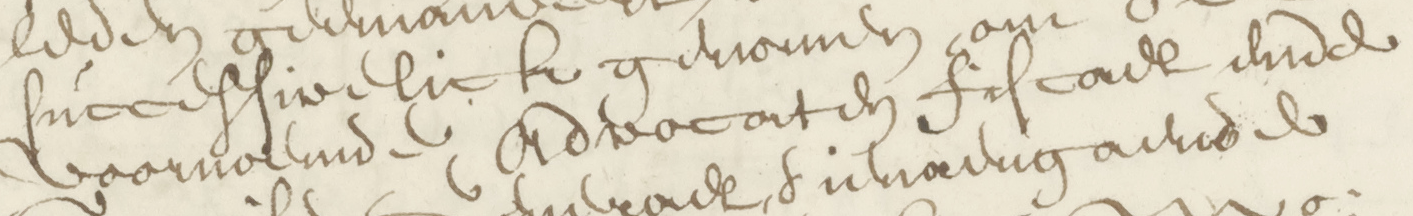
voornoemde Advocaten Fiscael ende
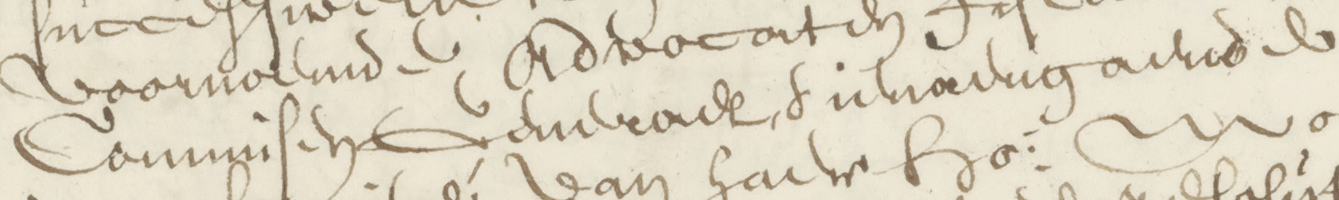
Commisen Generael, dienaengaende
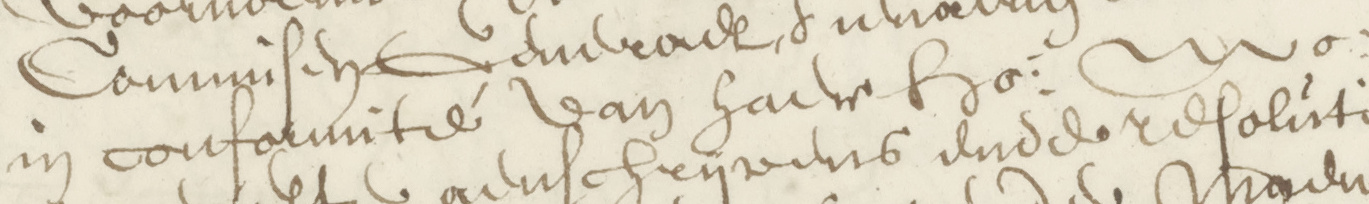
in conformité van haer Ho:Mo:
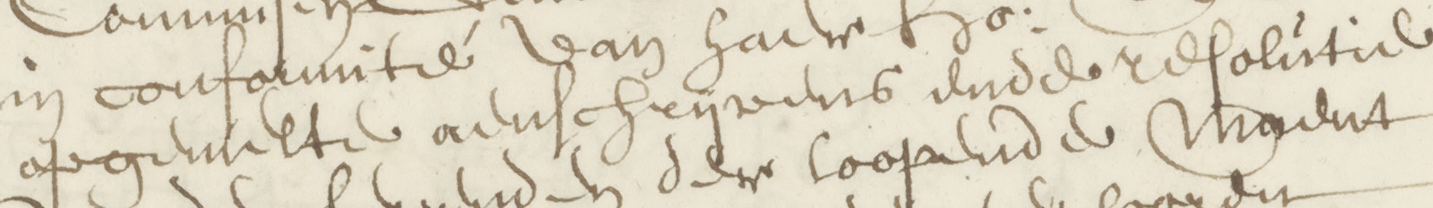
opgemelte aenschrijvens ende resolutie
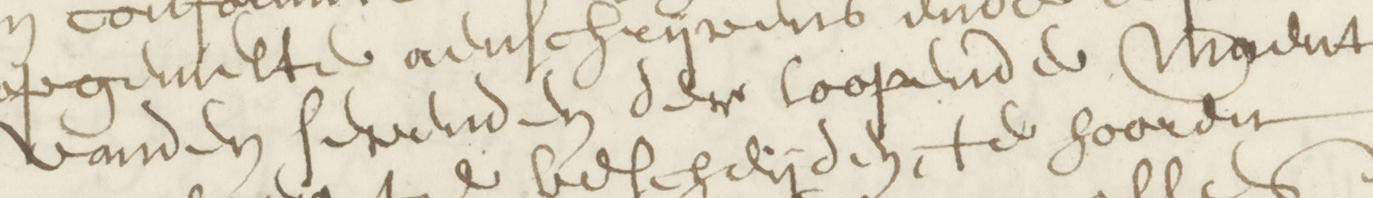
vanden sevenden der loopende Maent
